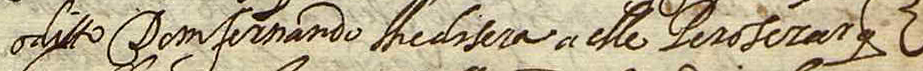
o ditto Dom fernando lhe disera a elle Pero Sezar q̄
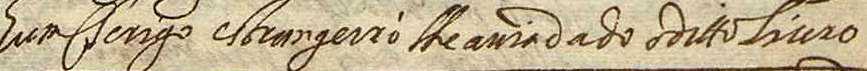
hum Clerigo estrangeiro lhe auia dado o ditto Liuro
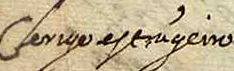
Clerigo estrāgeiro
